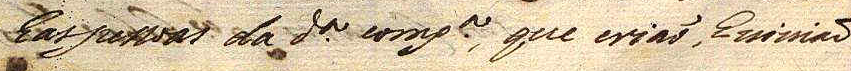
E as pessoas da d.a comp.a, que criaõ, E uiuiaõ
